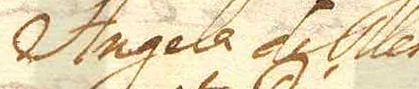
Angela de Mes
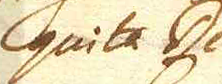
quita Ré
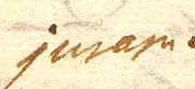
juram.
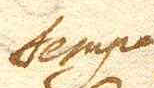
tempo
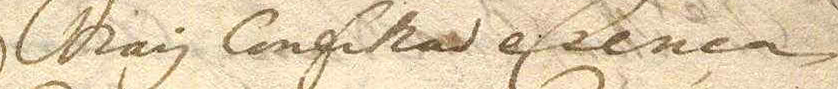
Mais Confissaõ e Crença
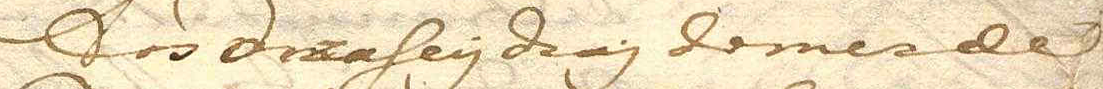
Aos dezaseis dias do mes de
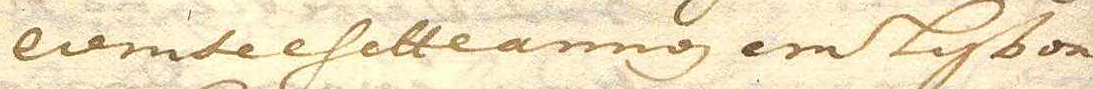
e vinte e sette annos em Lisboa
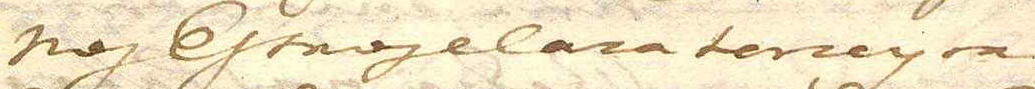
nos Estaos e caza terceyra
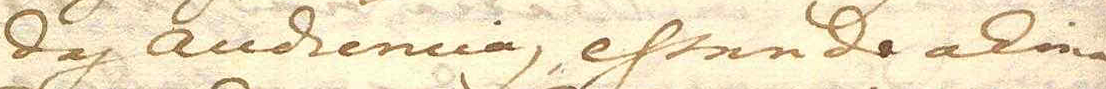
das audiencias, estando ahi na
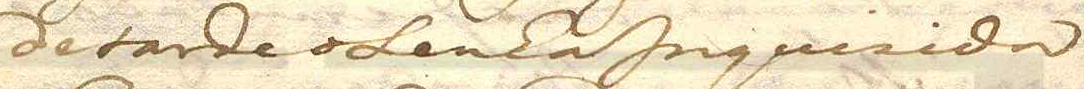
de tarde o senhor Jnquizidor
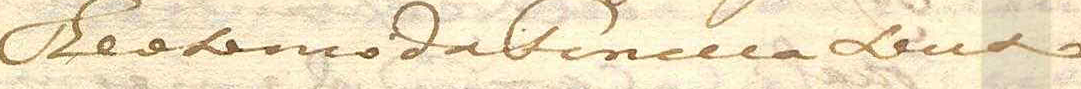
Theotonio da Fonceca souto
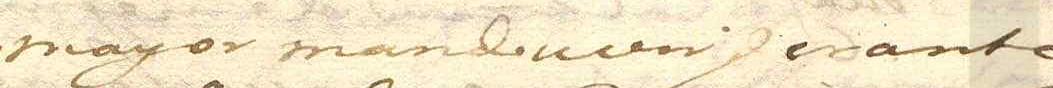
mayor mandou vir perante
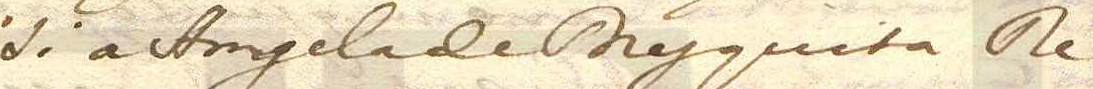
si a Angela de Mesquita Re
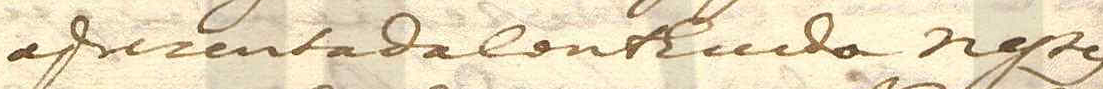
aprezentada Contheuda nestes
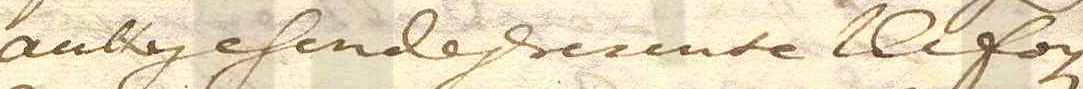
auttos e sendo prezente lhe foy
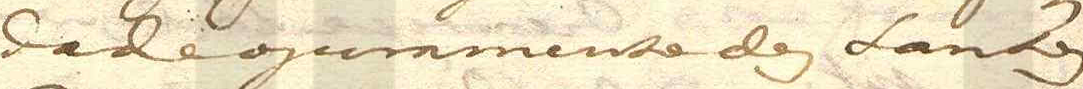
dado o juramento dos santos
